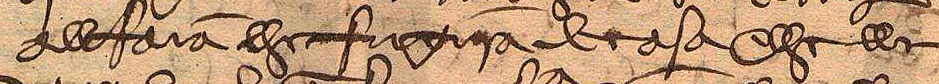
allfaia lhe fugira de casa e lhe lle
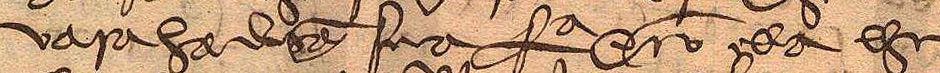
vara ha dita sua fa e c̄o ella lhe
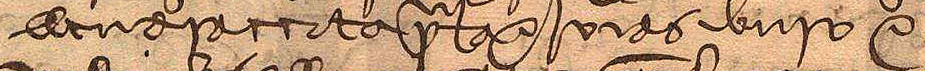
lleuara certa p̄ta e Joias douro e
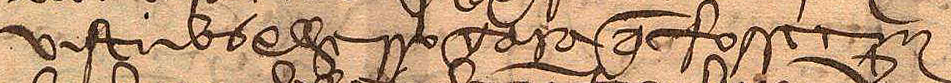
vestidos e lhe rrogara q̄ fosse em
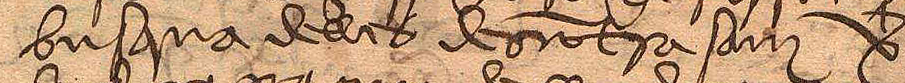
busqua delles descōtra sam Vte
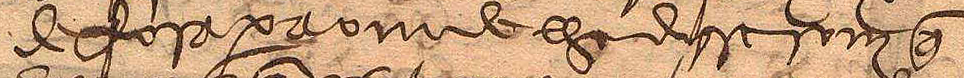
de fora ꝑa omde lhe disserom q̄
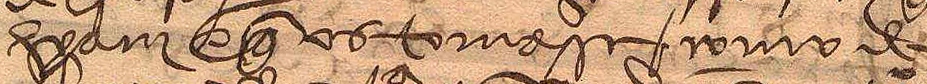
hyam e q̄ os tomasse / como de
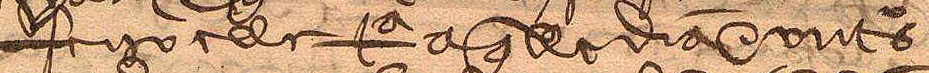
feito elle ta aq̄lle dia e outos
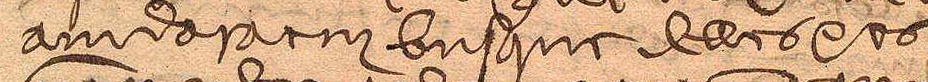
amdara em busque delles e os
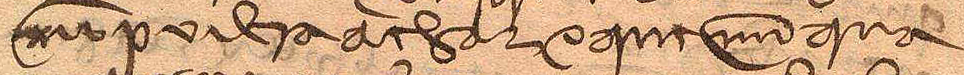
n̄o podera achar e que nūqua
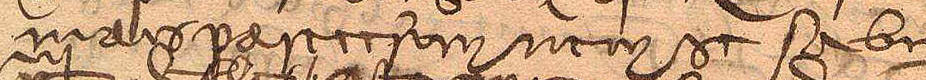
mais parecerom nem se sabe
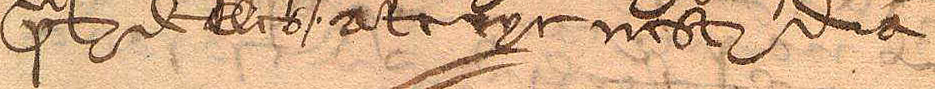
p̄te delles /. ate oye neste dia
